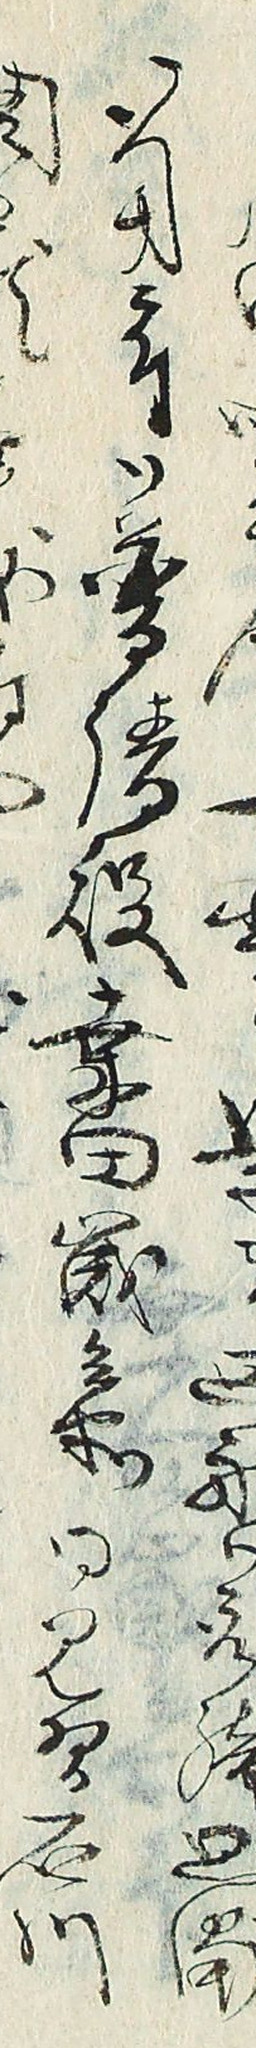御用に付御普請役桑田歳兵衛同見習石川
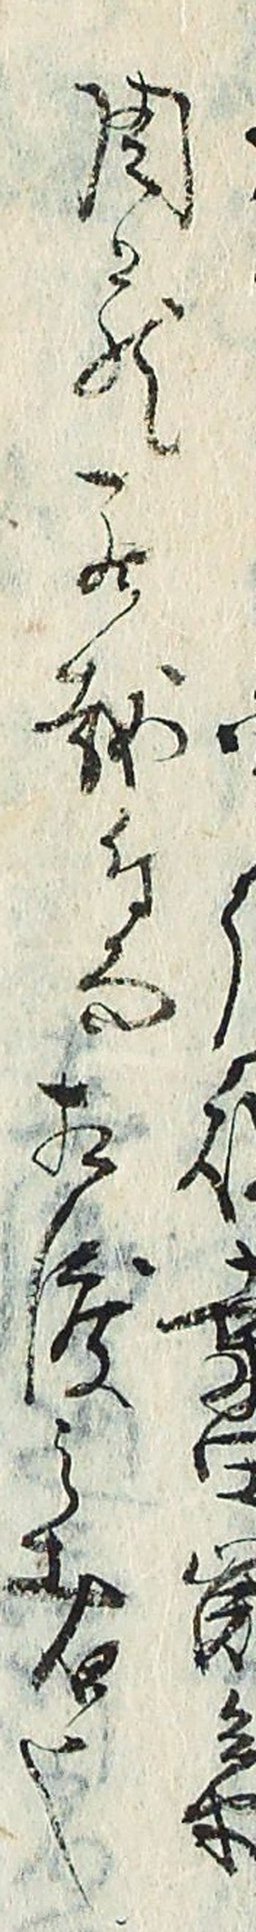周蔵罷越付て相渡之者也
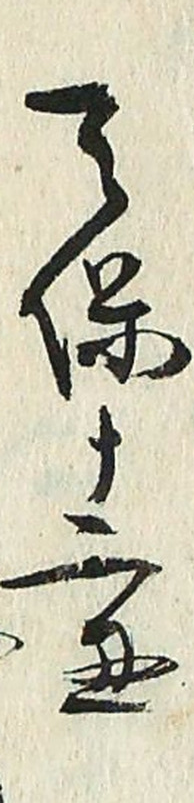天保十二丑
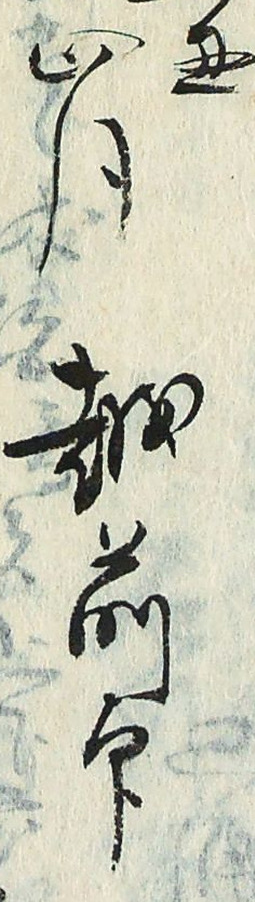四月越前印
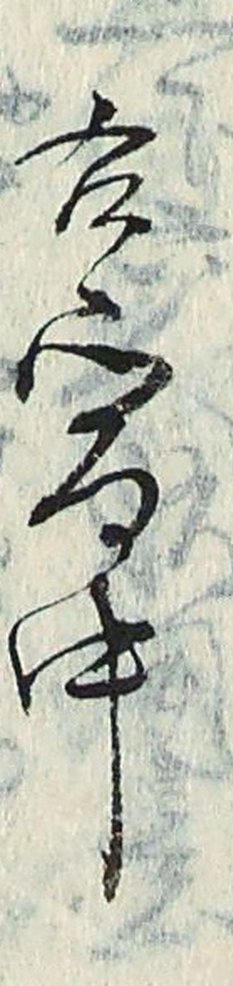右宿中
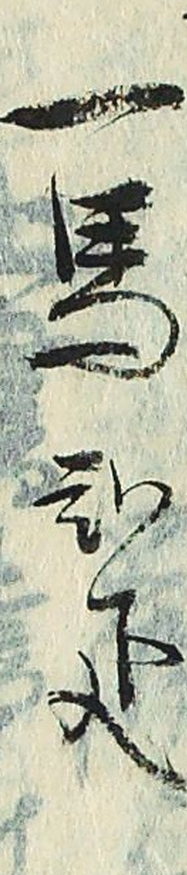一馬弐疋
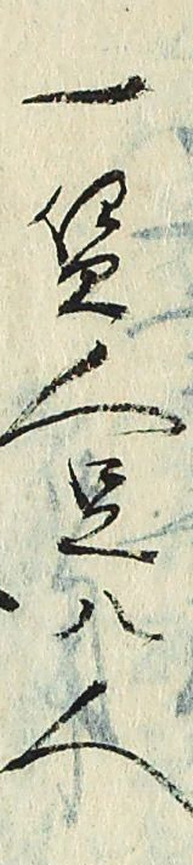一賃人足八人
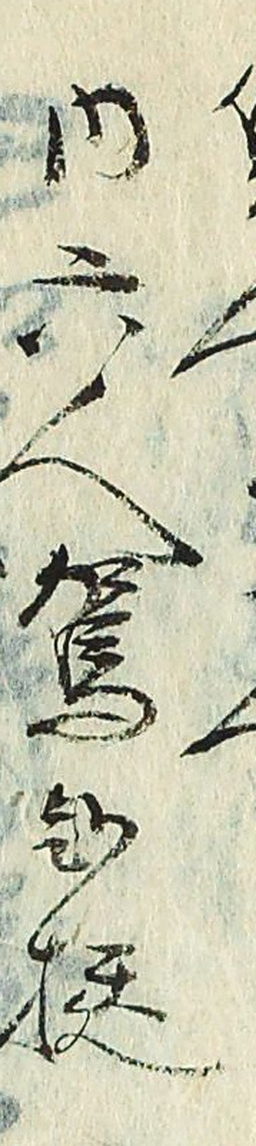内六人駕弐挺
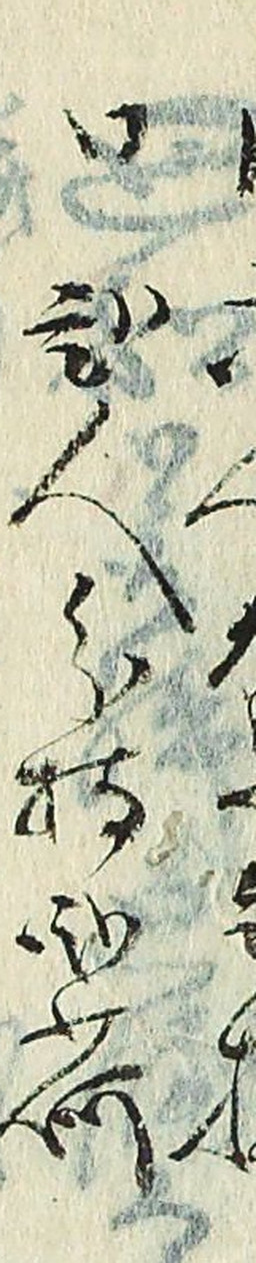同弐人分持弐荷
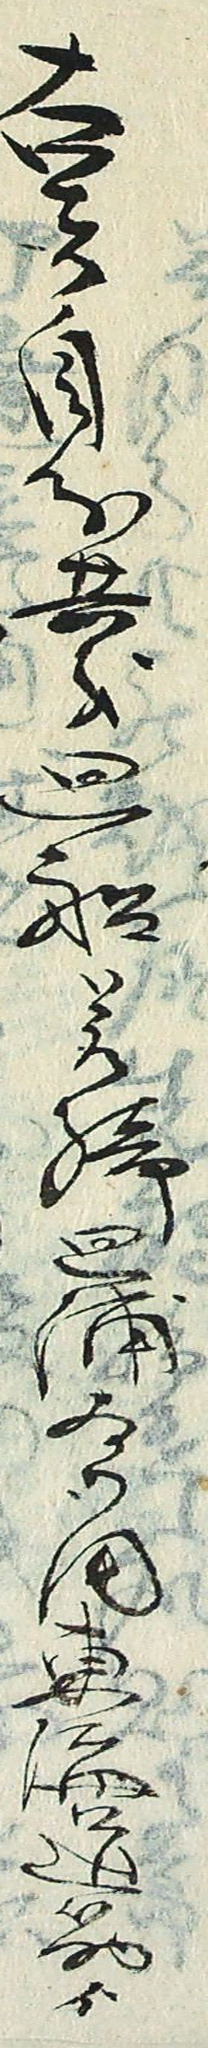右は自分共義廻船御取締廻浦為御用東海道筋ゟ
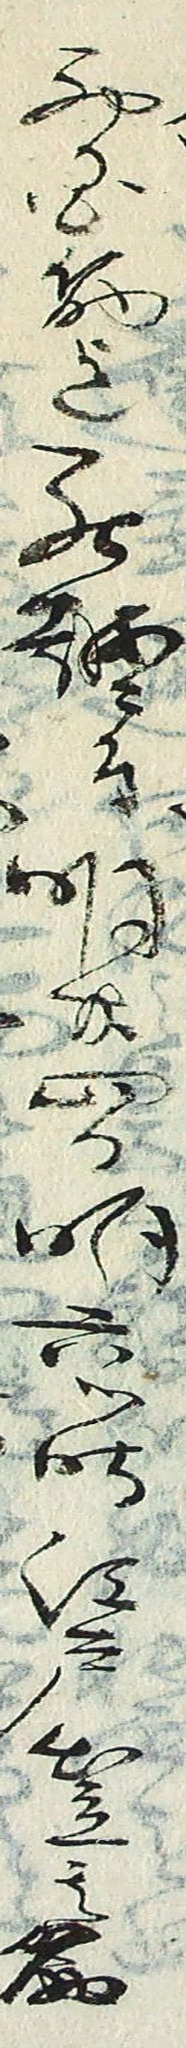西国筋迄罷越に付明廿四日六つ時江戸出立其筋
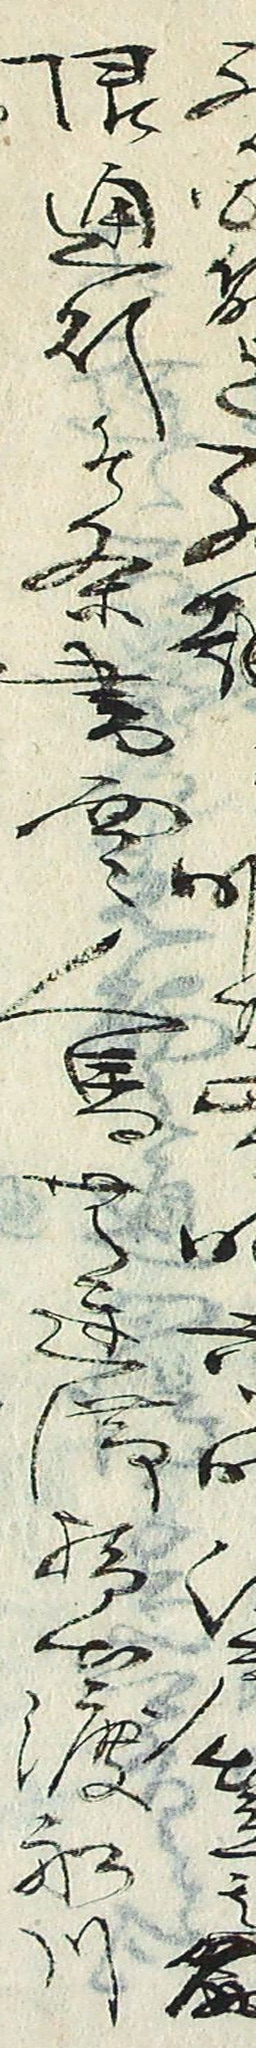限通行候条書面之人馬無遅滞指出渡船川
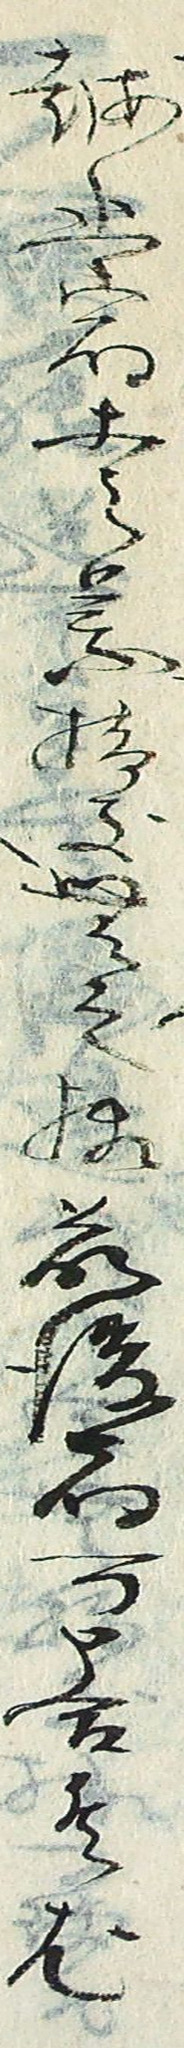越止宿等之義指支無之様前後宿可申合候尤
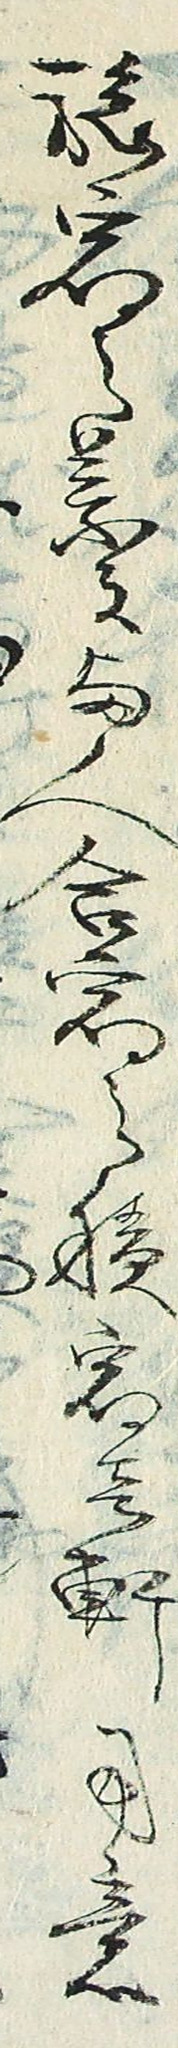旅宿之義は両人合宿之積宿壱軒用意
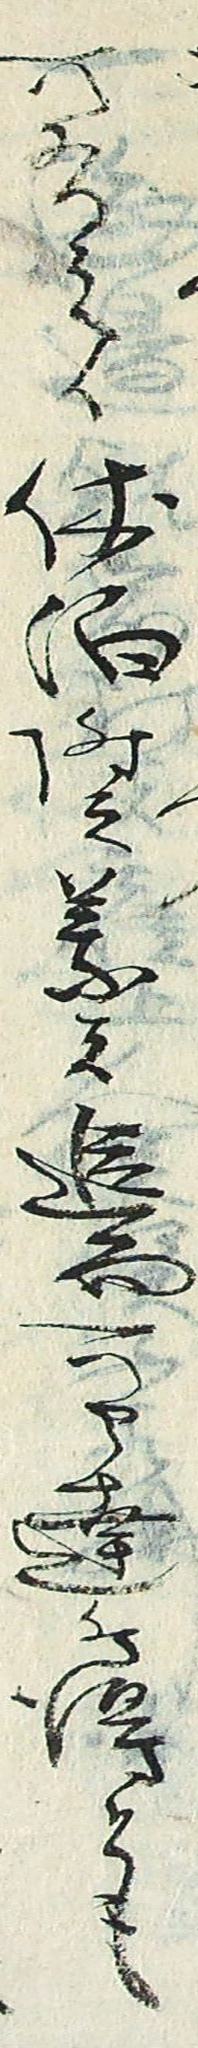可有之候休泊附之義は追て可申達候得とも
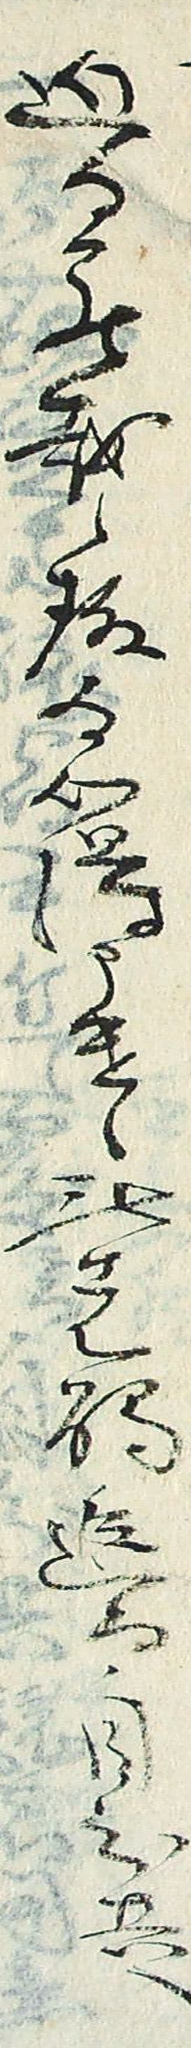近日罷越候趣為心得申遣候此先触追て自分共へ
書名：公辺御役人為御廻浦御立越諸御用一巻
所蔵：鳴門教育大学 Naruto University of Education
